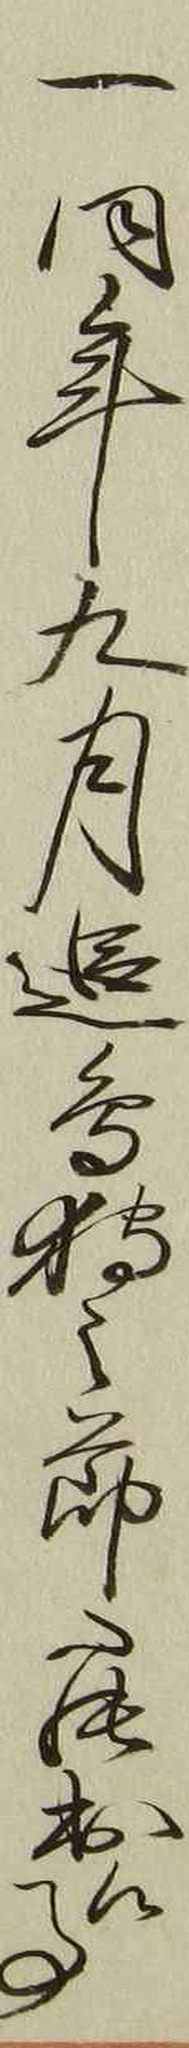一同年九月追鳥狩之節罷出候事
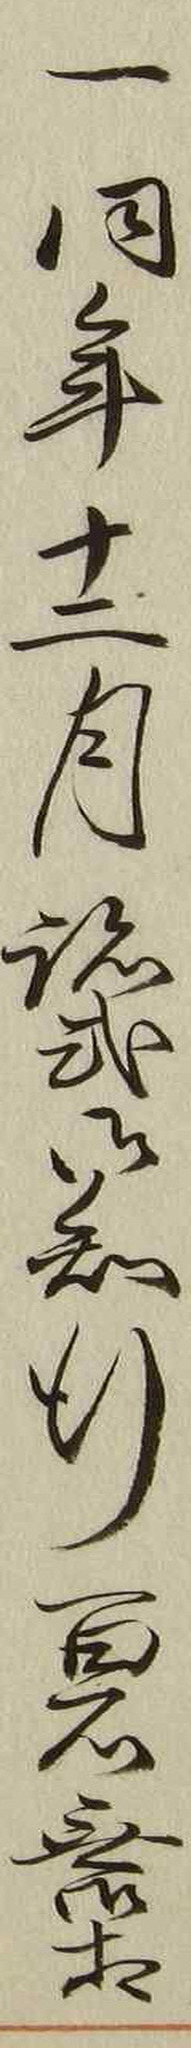一同年十二月跡式知行百石無御相
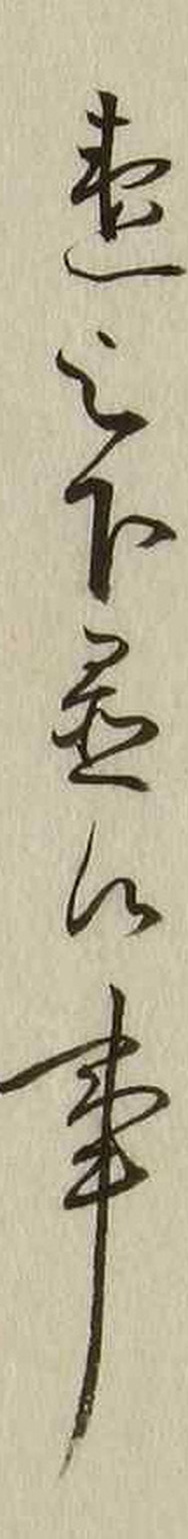違被下候事
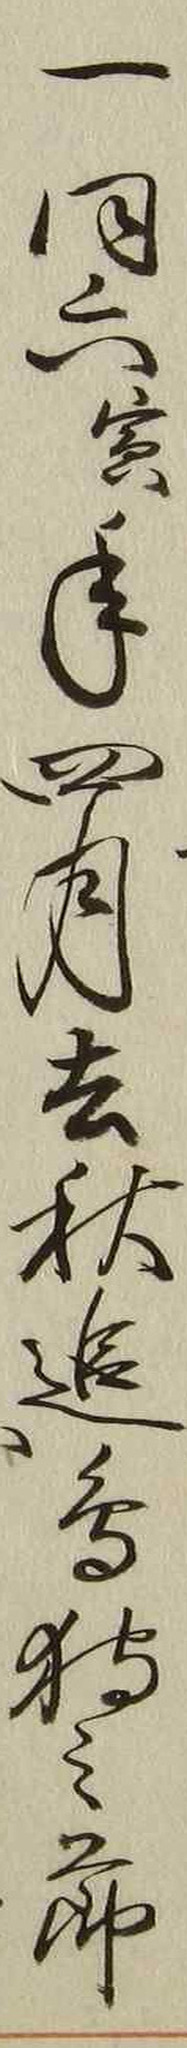一同六寅年四月去秋追鳥狩之節
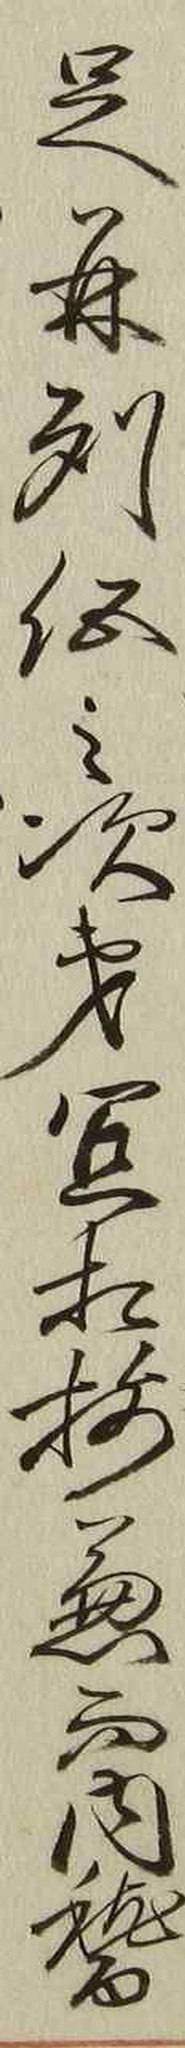足並列伍之次第宜相揃兼而内稽
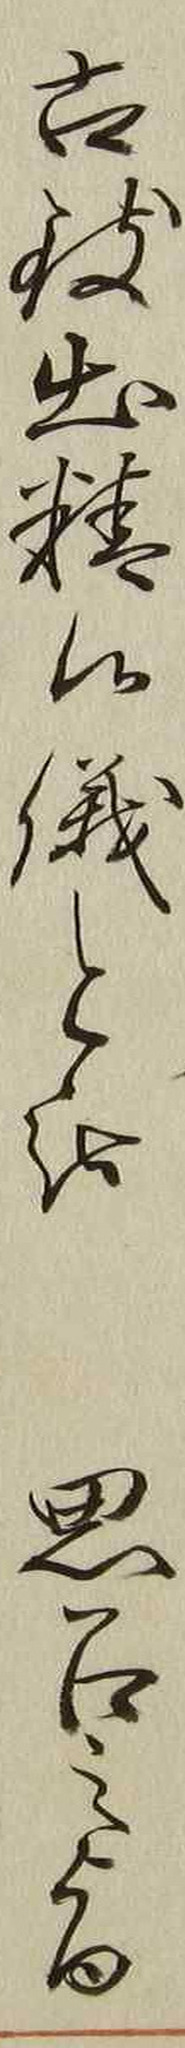古致出精候儀と被思召之旨
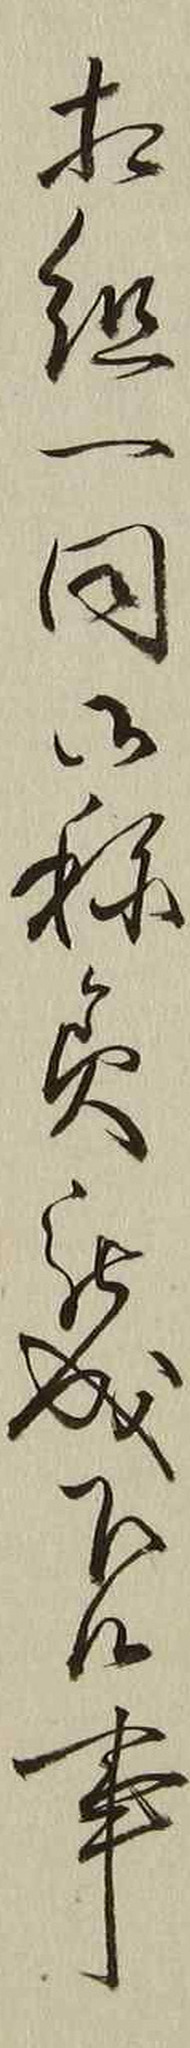相組一同御称美被成下候事
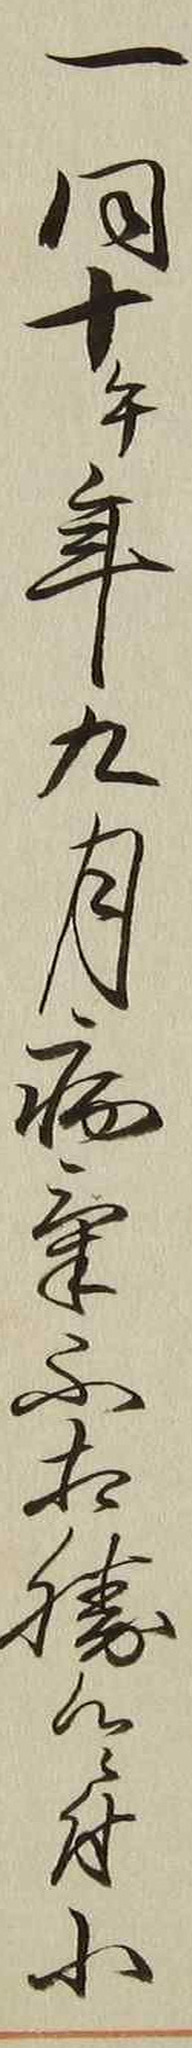一同十午年九月病気不相勝候ニ付小
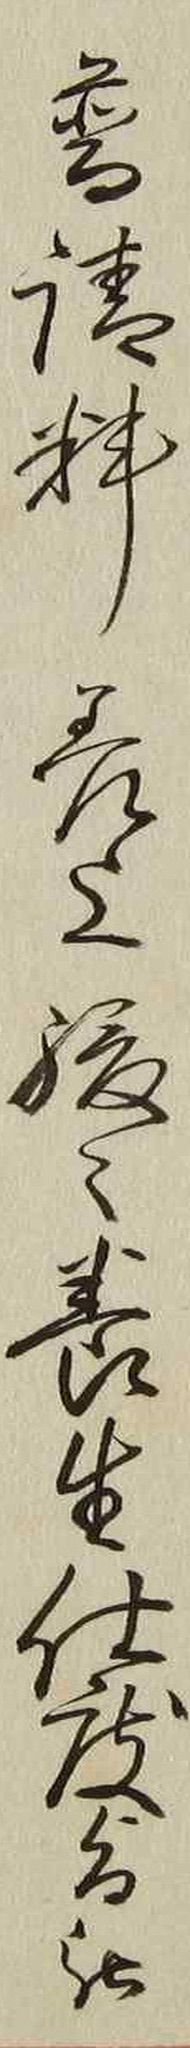普請料差上々養生仕度旨被
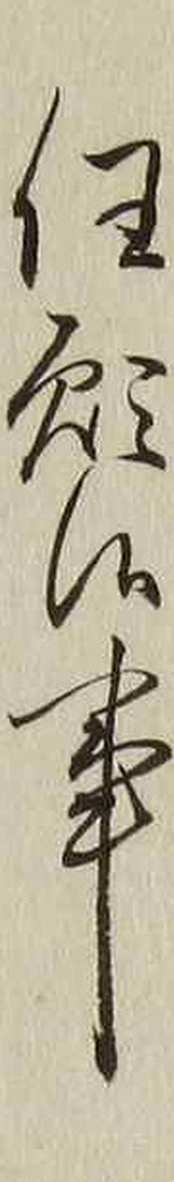任願候事
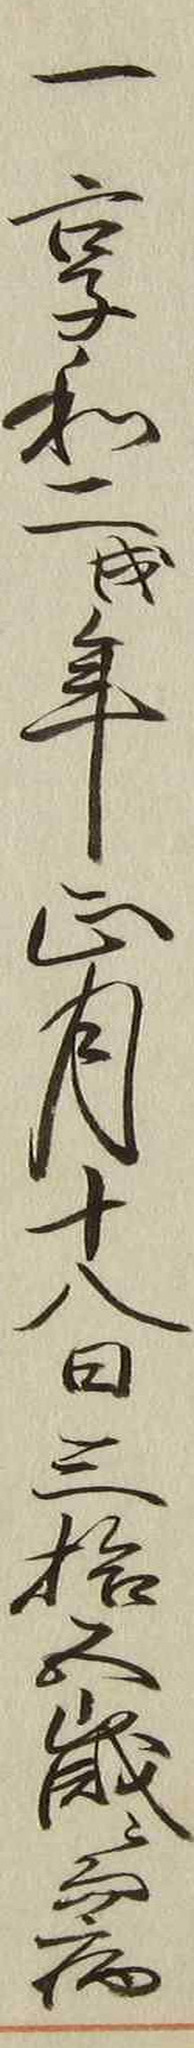一享和二戌年正月十八日三拾五歳ニ而病
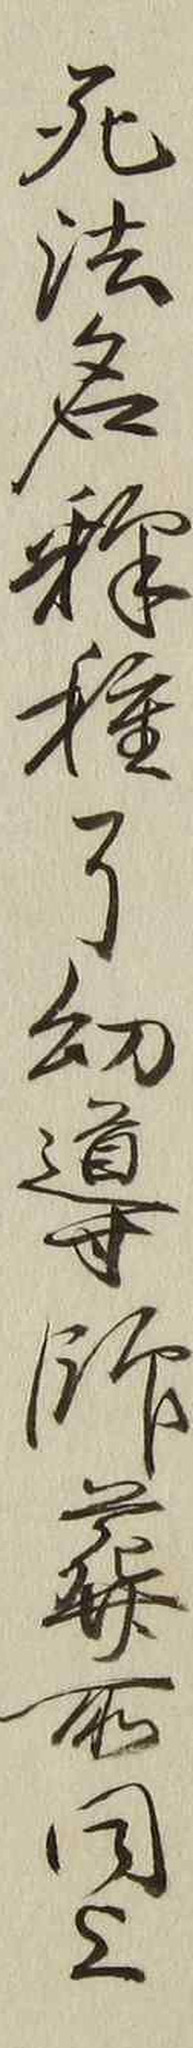死法名釈種了幼導師葬所同上
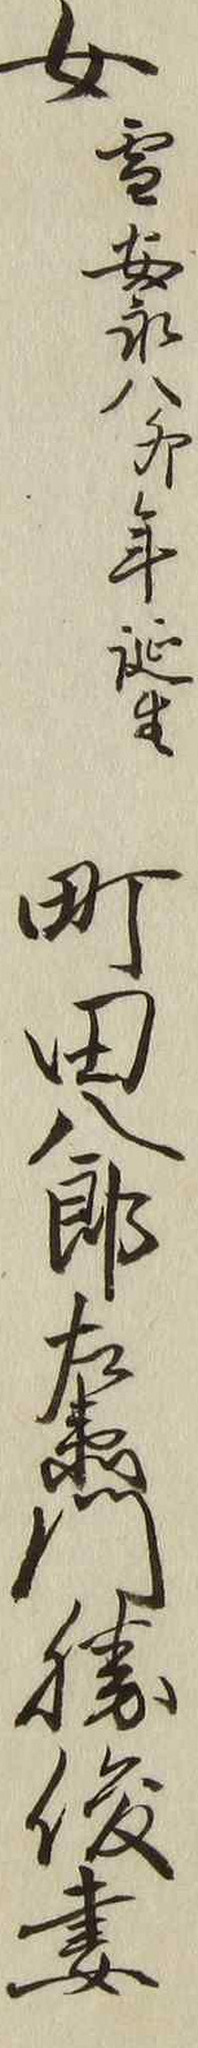女雪安永八卯年誕生町田八郎右衛門後妻
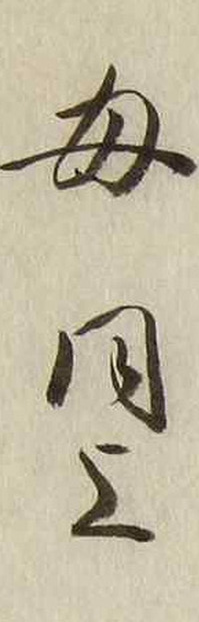母同上

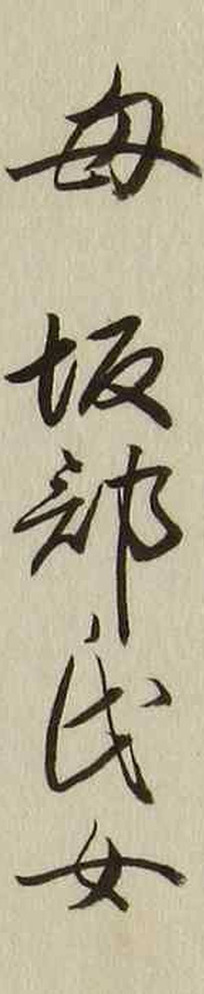母坂部氏女
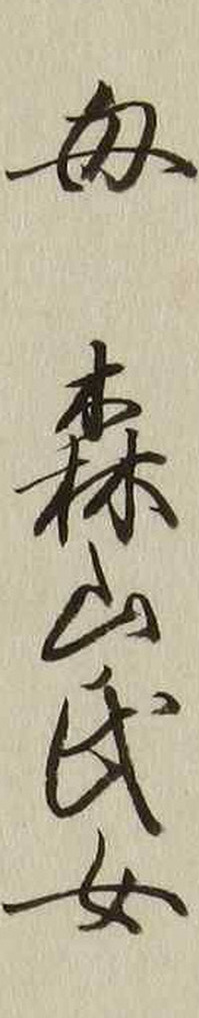母森山氏女
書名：諸士系譜　巻之54　ほ之部1
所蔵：会津若松市立会津図書館
